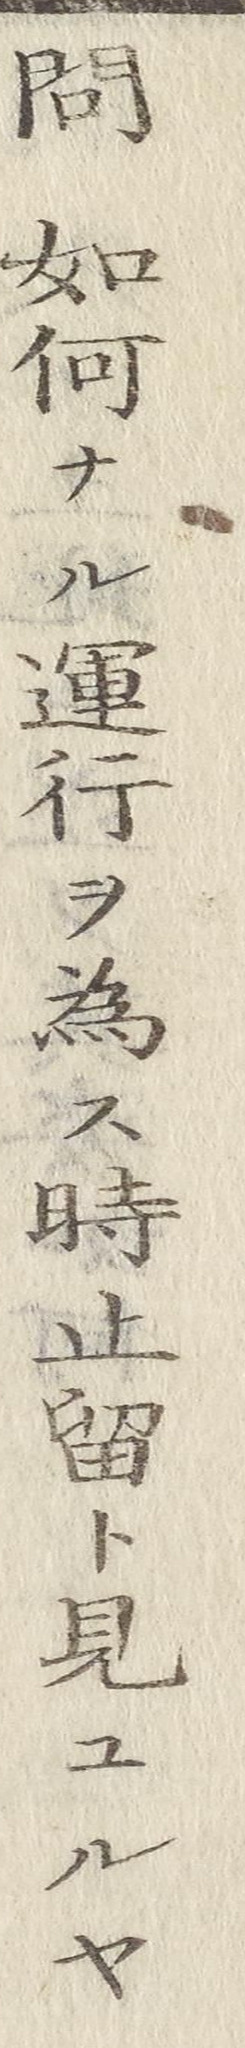問如何ナル運行ヲ為ス時止留ト見ユルヤ
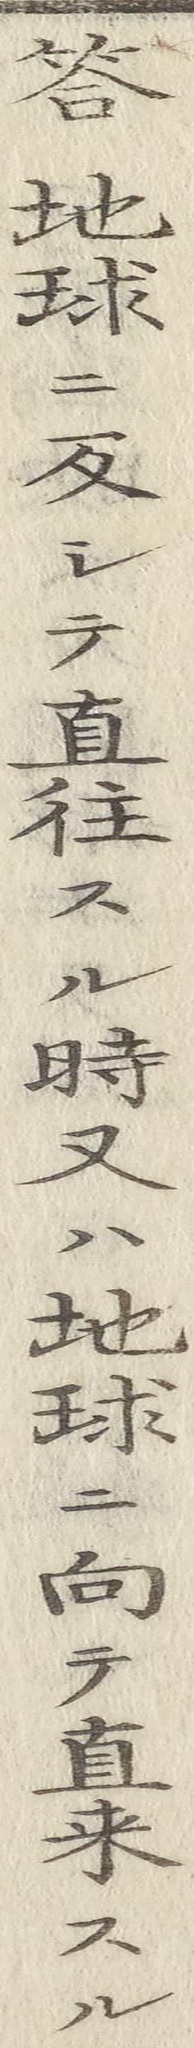答地球ニ反シテ直往スル時又ハ地球ニ向テ直来スル
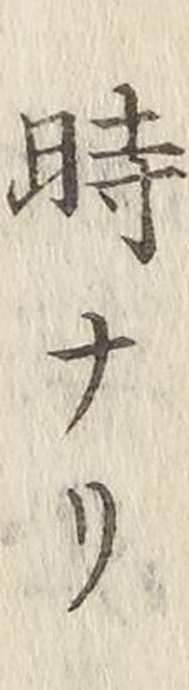時ナリ
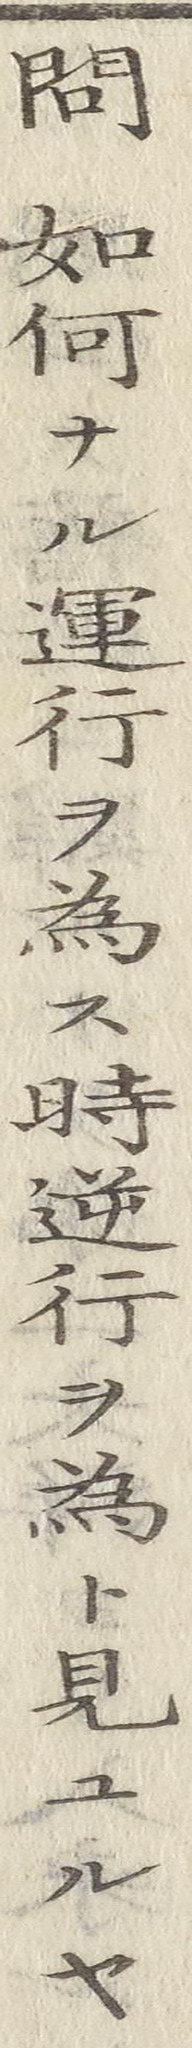問如何ナル運行ヲ為ス時逆行ヲ為ト見ユルヤ
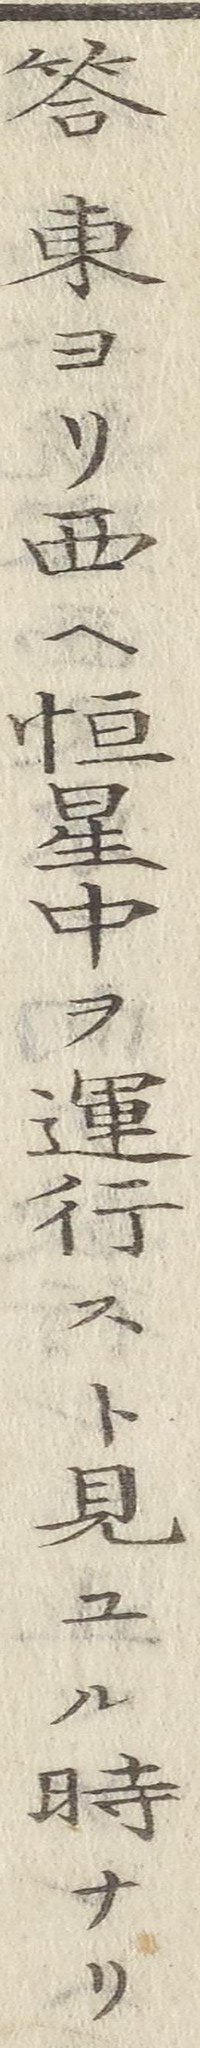答東ヨリ西ヘ恒星中ヲ運行スト見ユル時ナリ
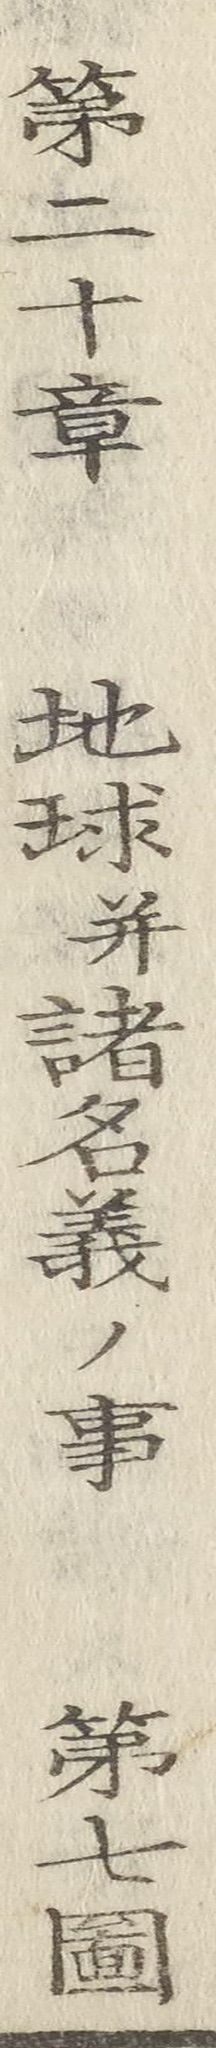第二十章地球幷諸名義ノ事第七図
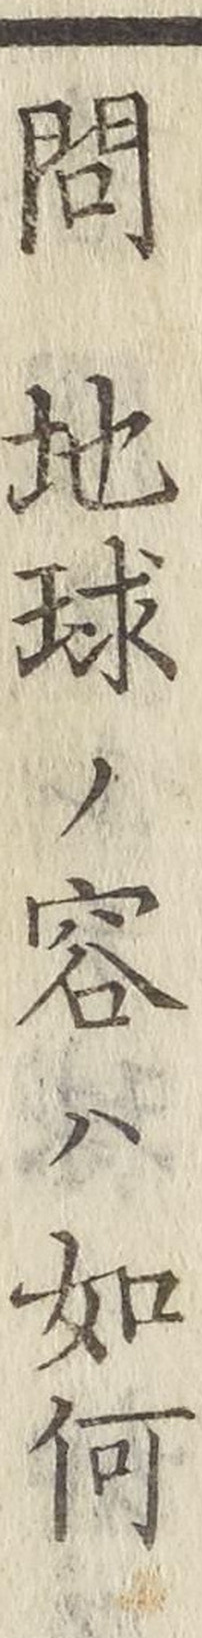問地球ノ容ハ如何

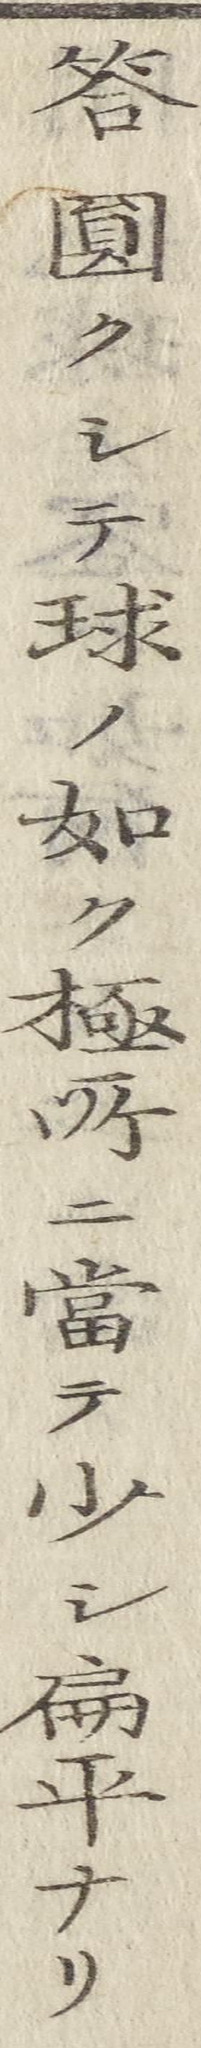答円クシテ球ノ如ク極所ニ当テ少シ扁平ナリ
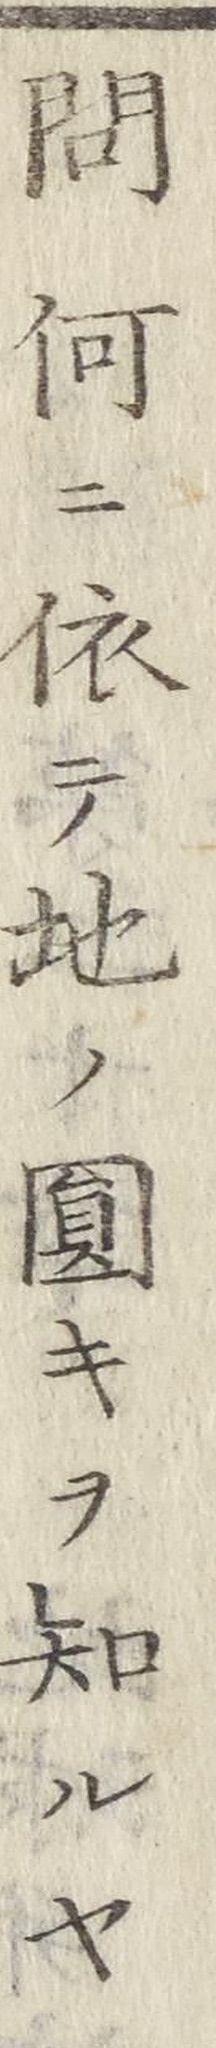問何ニ依テ地ノ円キヲ知ルヤ
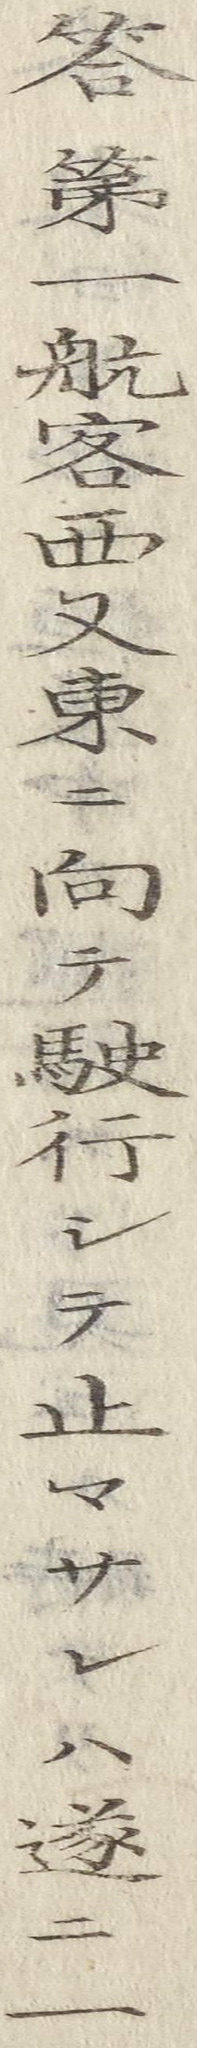答第一航客西又東ニ向テ駛行シテ止マサレハ遂ニ一
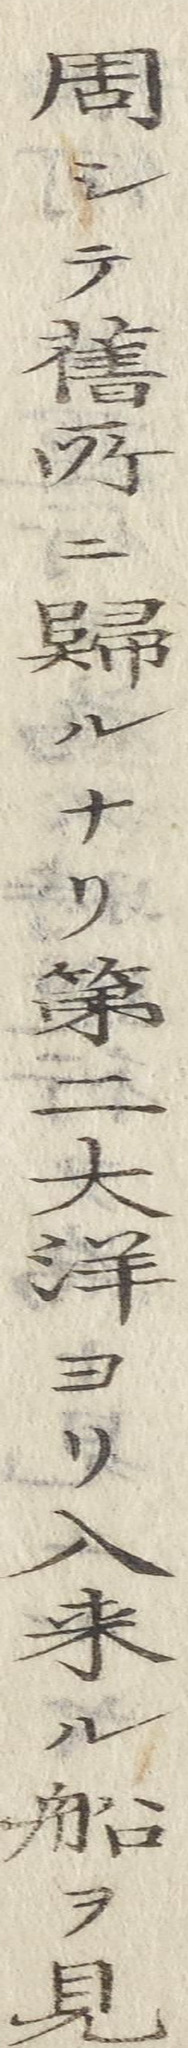周シテ旧所ニ帰ルナリ第二大洋ヨリ入来ル船ヲ見
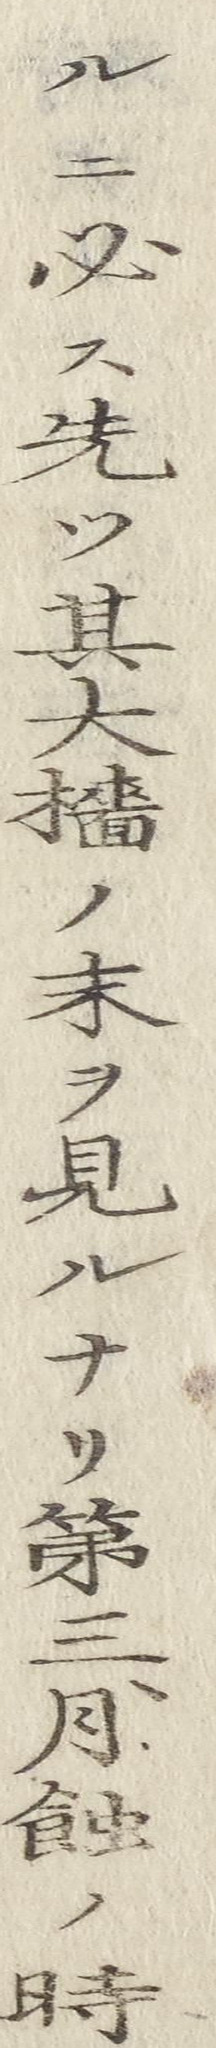ルニ必ス先ツ其大檣ノ末ヲ見ルナリ第三、月蝕ノ時
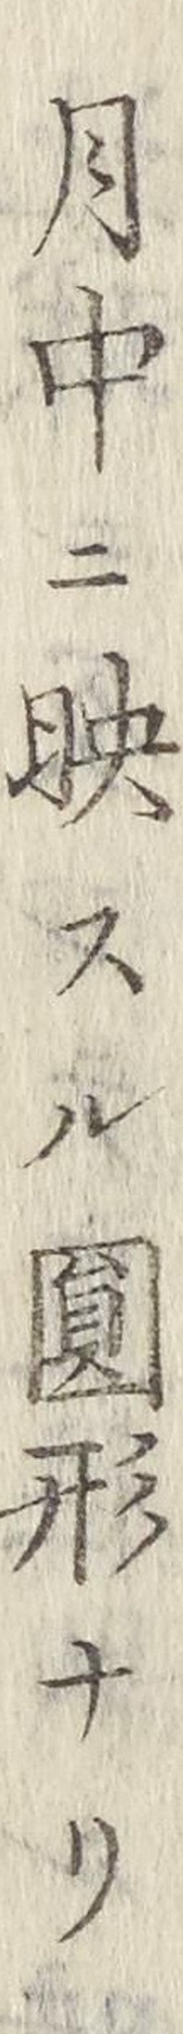月中ニ映スル図形ナリ
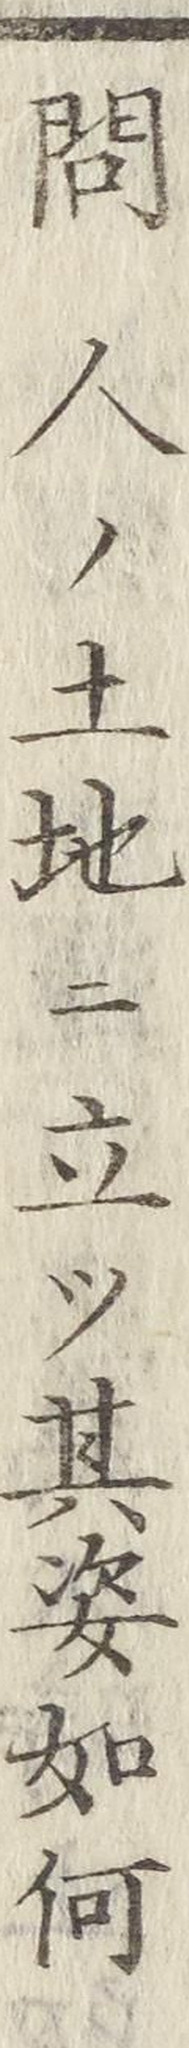問人ノ土地ニ立ツ其姿如何
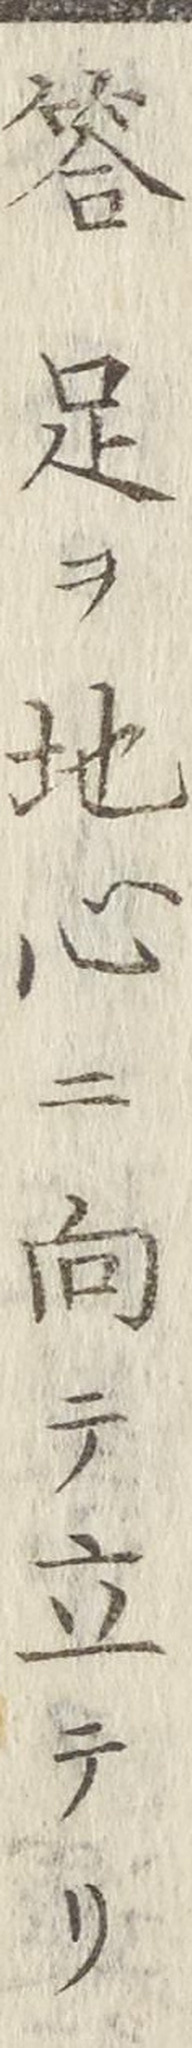答足ヲ地心ニ向テ立テリ
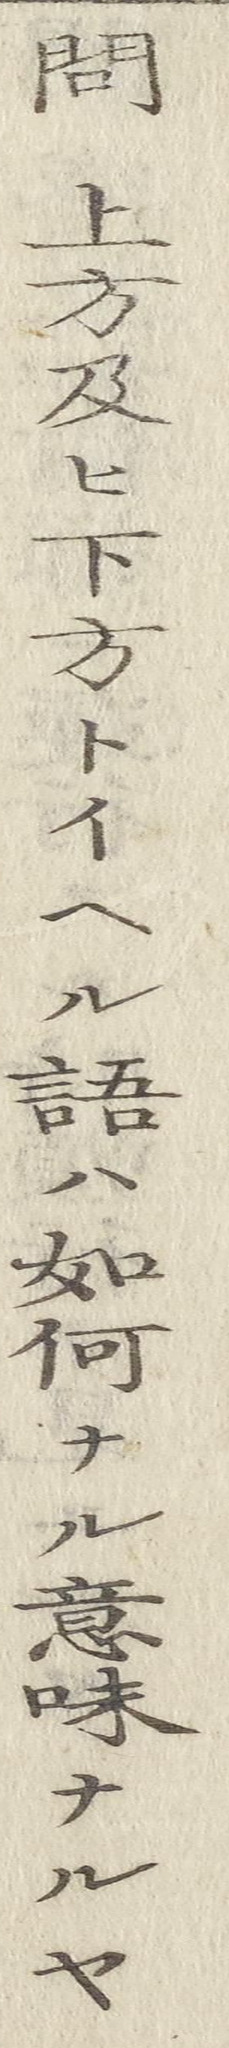問上方及ヒ下方トイヘル語ハ如何ナル意味ナルヤ
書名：星学圖説　上
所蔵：東京大学地震研究所図書室 Earthquake Research Institute Library, The University of Tokyo, JAPAN
